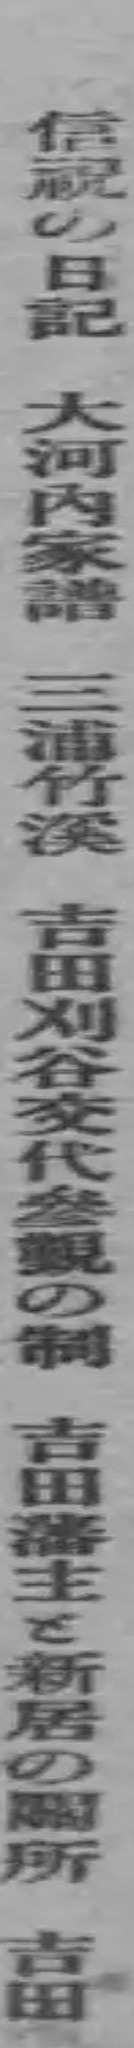信祝の日記大河内家譜三浦竹渓吉田刈谷交代参観の制吉田藩主と新居の関所吉田
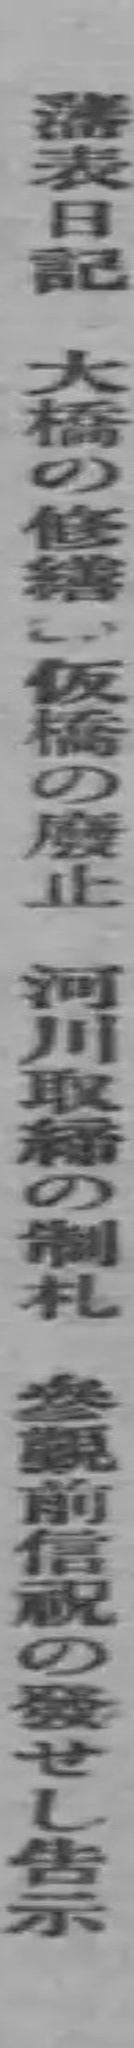藩表日記大橋の修繕仮橋の廃止河川取締の制札参観前信祝の発せし告示
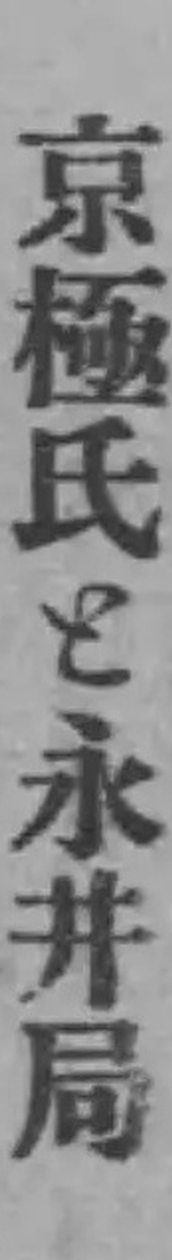京極氏と永井局
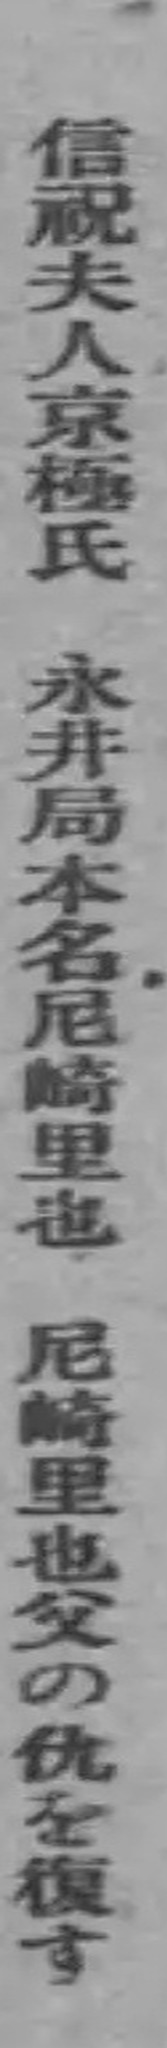信祝夫人京極氏永井局本名尼崎里也尼崎里也父の仇を復す
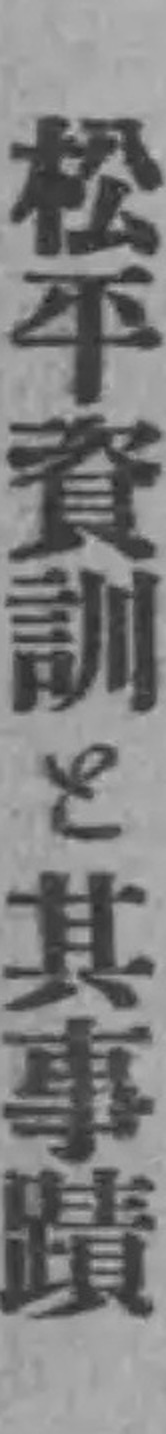松平資訓と其事蹟

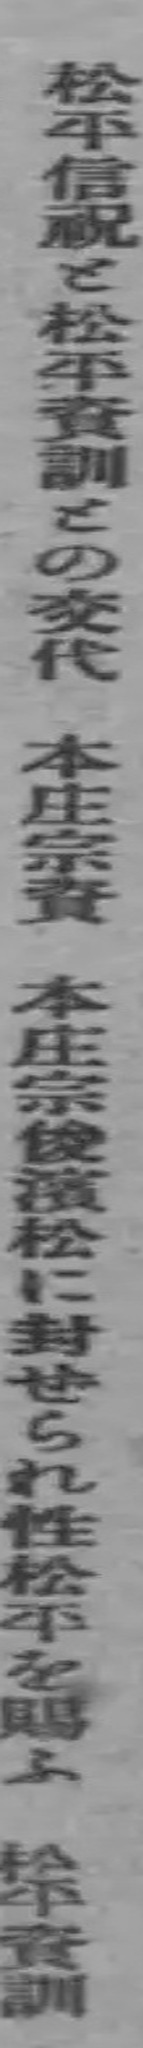松平信祝と松平資訓との交代本庄宗資本庄宗俊浜松に封せられ性松平を賜ふ松平資訓
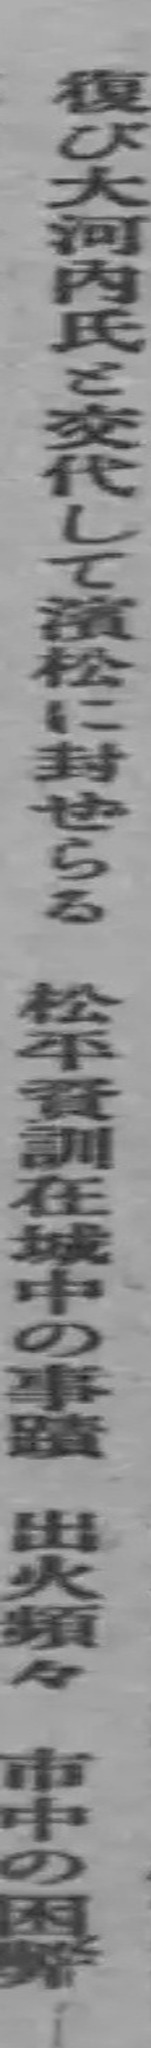復び大河内氏と交代して浜松に封ぜらる松平資訓在城中の事蹟出火頻々市中の困弊
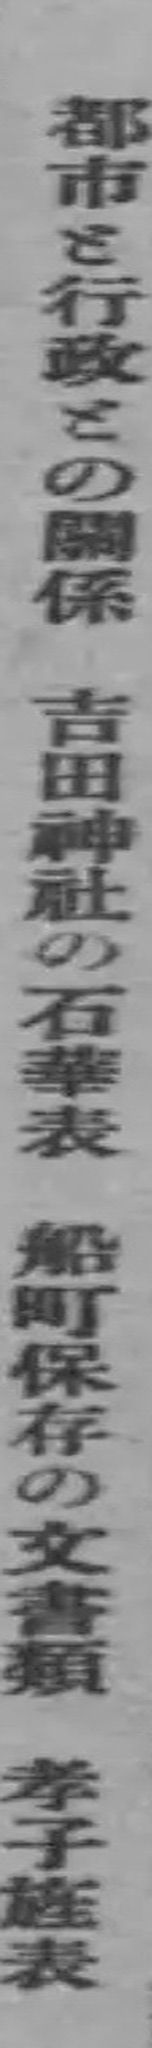都市と行政との関係吉田神社の石華表船町保存の文書類孝子旌表
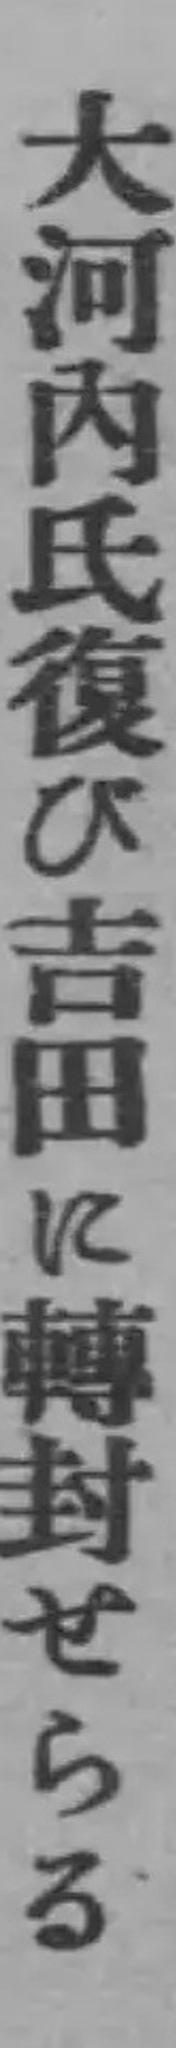大河内氏復び吉田に転封せらる
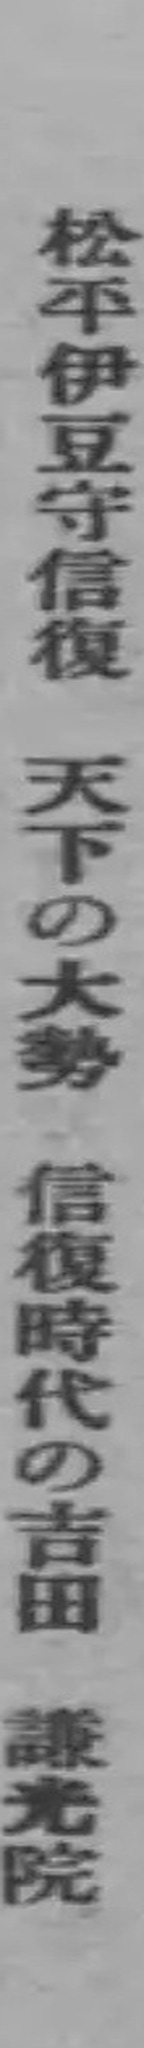松平伊豆守信復天下の大勢信復時代の吉田謙光院
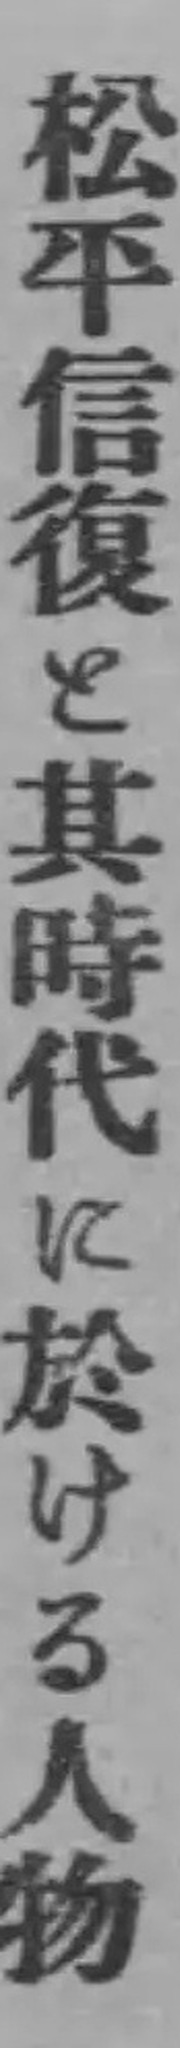松平信復と其時代に於ける人物
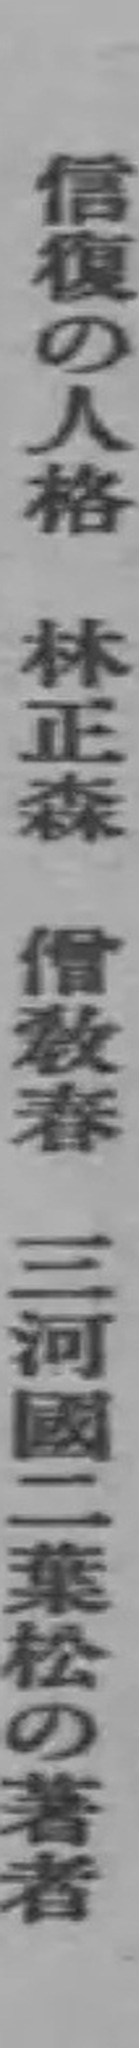信復の人格林正森僧教春三河国二葉松の著者
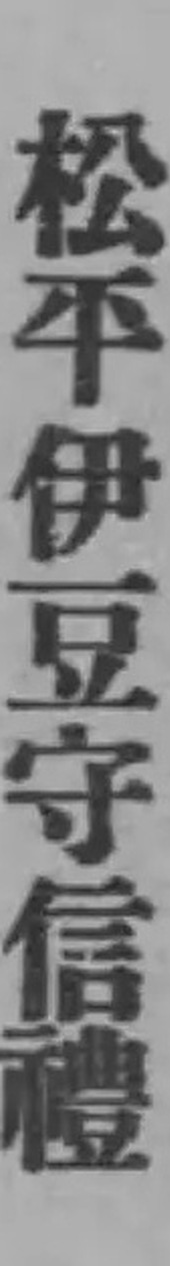松平伊豆守信禮
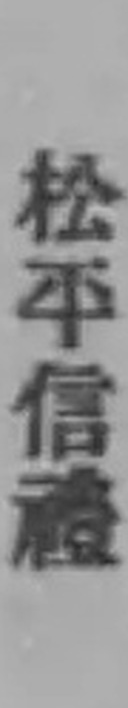松平信禮
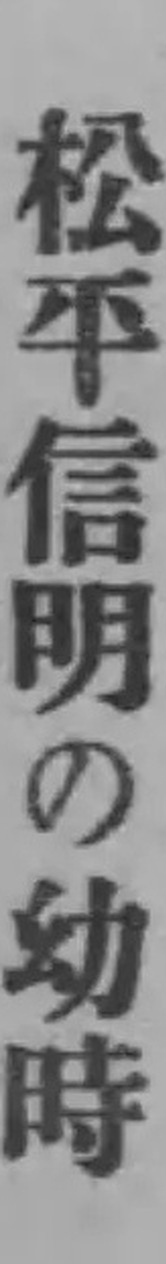松平信明の幼時
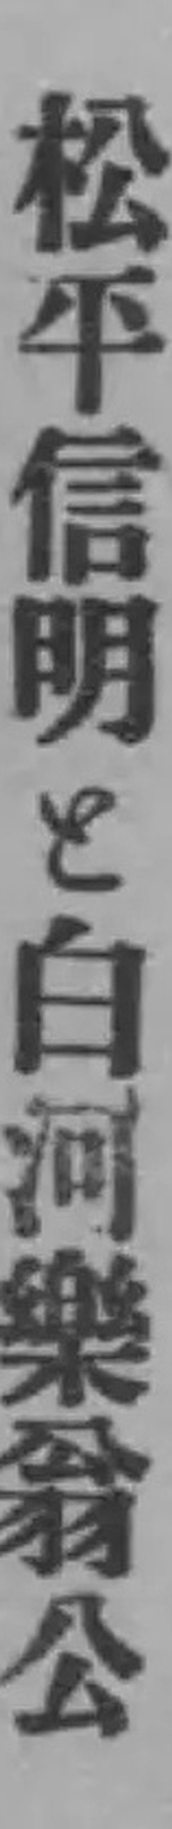松平信明と白河楽翁公
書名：豊橋市史談
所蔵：国立国会図書館 National Diet Library, JAPAN
